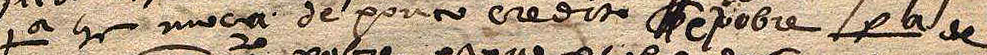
ta he moça de pouco credito e pobre fa de
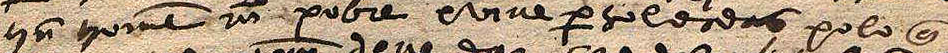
hū homē mto pobre e viue ꝑ soldadas polo q̄
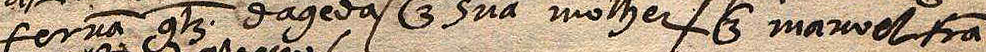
fernā ḡlz dageda / item Sua molher / item manoeL frā
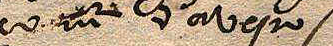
co mor ē avejro
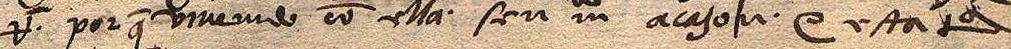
R porq̄ viuemdo c̄o ella seu mdo a casou e esta ta
